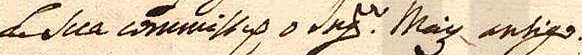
de sua commissaõ o Inq.or Maiz antigo.
